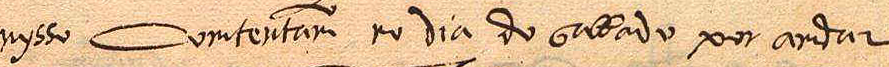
nysso Comtentamto no dia do sabbado por amdar
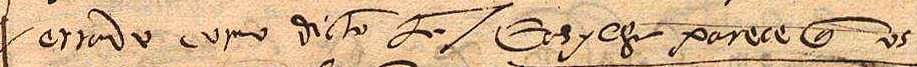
errado como dicto tē / E asy lhe parece q̄ os
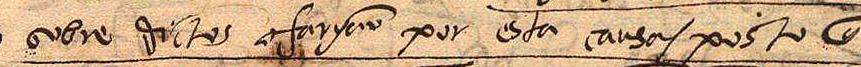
sobredictos o faryão por esta causa / posto q̄
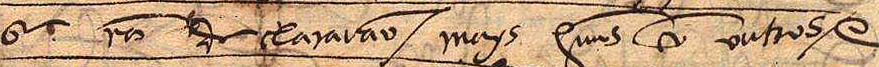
se não declararão mays hūus cō outros / e
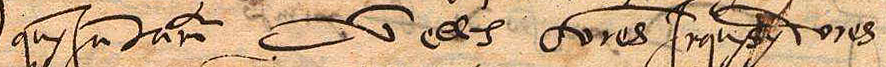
quy Jūtamte Cō elles sōres Jnquysydores
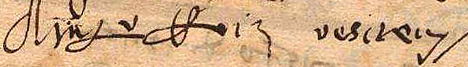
Amto Rōiz o escreuy /
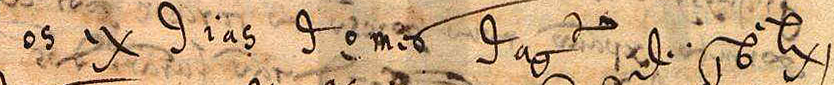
Aos IX dias do mes dagto de jbclxj
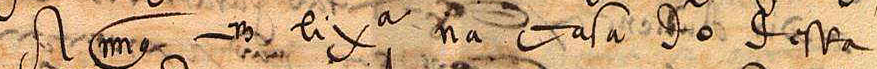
An̄no em lixa na Casa do despa
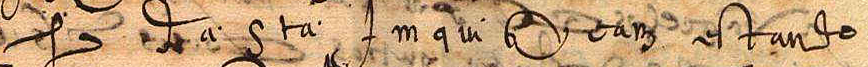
cho da Sta. Jmquisycam estando
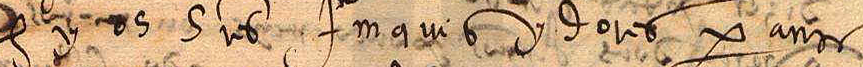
hy os Sr̄es Jmquisydores ꝑante
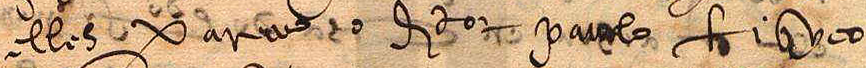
elles pareceo o dtor paulo fisyco
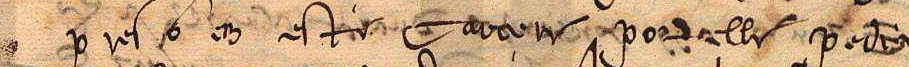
preso em este carcere por elle pedir
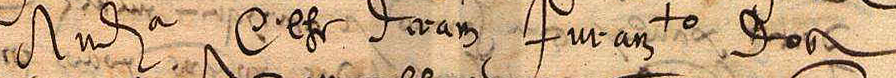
Auda e lhe deram Juramto dos
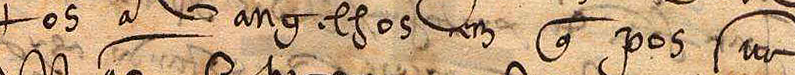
Stos avangelhos em q̄ pos sua
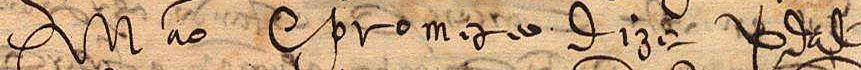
mão e prometeo dizer ꝟdade
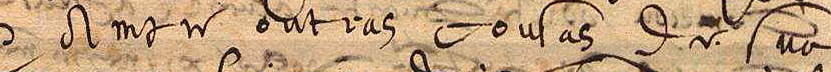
e Amtre outras cousas de sua
